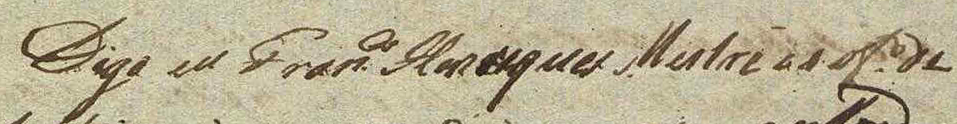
Digo eu Fran.co Henriques Mestre do off.o de
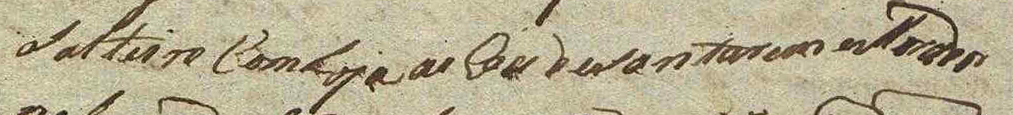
salteiro Com loja ao Caes de santarem e Morador
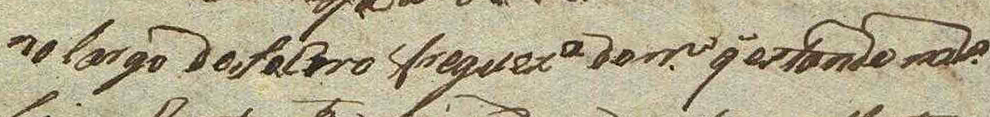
no largo do SoCoro freguez.a do m.o q̄ estando na d.a
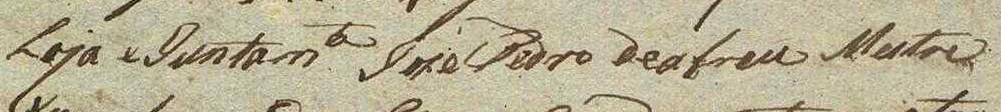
Loja e Iuntam.te Iozé Pedro de abreu Mestre
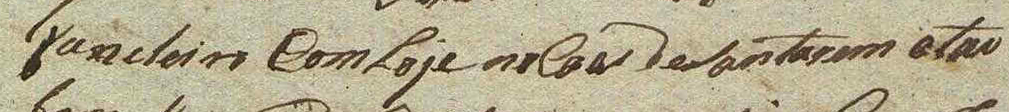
yaneleiro Com Loje no Caes de santaram e tao
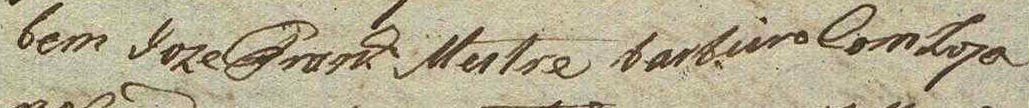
bem Ioze Fran.co Mestre barbeiro Com Loja
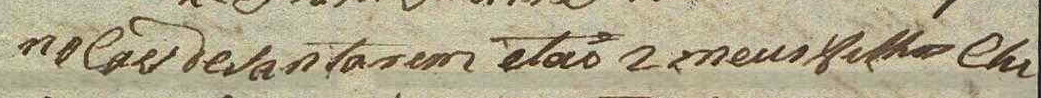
no Caes de santarem e taõ 2 meus filhos che
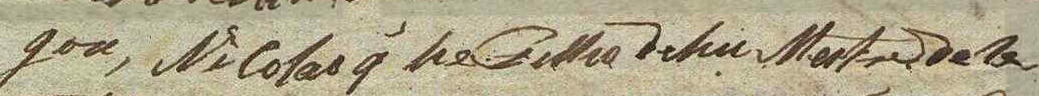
gou, Nicolao q̄ he Filho de hu Mestre de Re
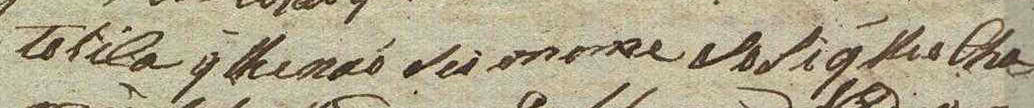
toriCa q̄ lhe naõ sei o nome so si q lhe o Cha
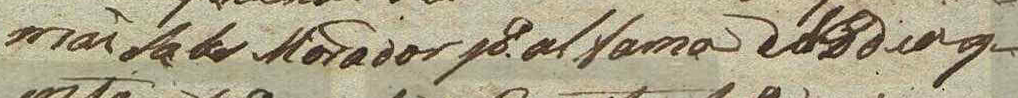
maõ sales Morador p.a alfama e 18 dia q
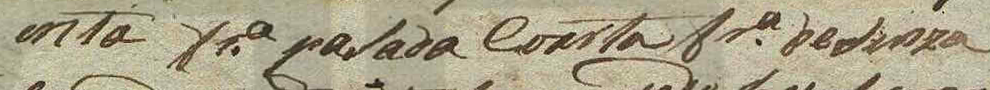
enta fr.a pasada Coarta fr.a de sinza
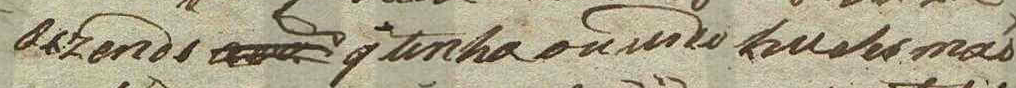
dizendo _ q̄ tinha ouuido hu sermaõ
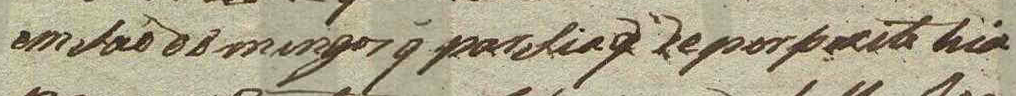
em saõ domingos q̄ parecia q̄ de porpozito hia
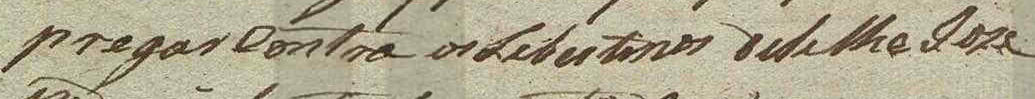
pregar contra os Lebertinos deselhe Ioze
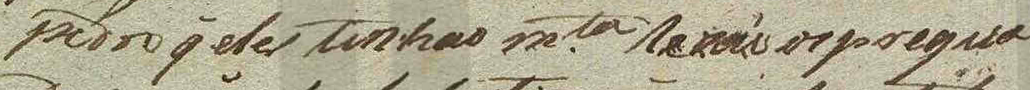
pedro q̄ eles tinhaõ m.ta Rezaõ os prequa
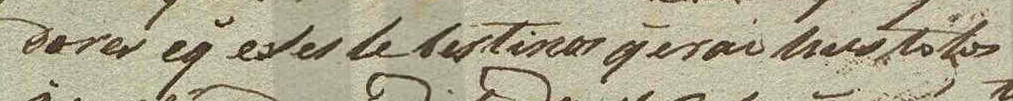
dores e q̄ eses lebertinos q̄ eraõ hus tolos
